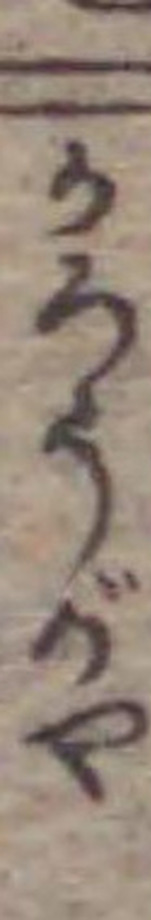かろうがや

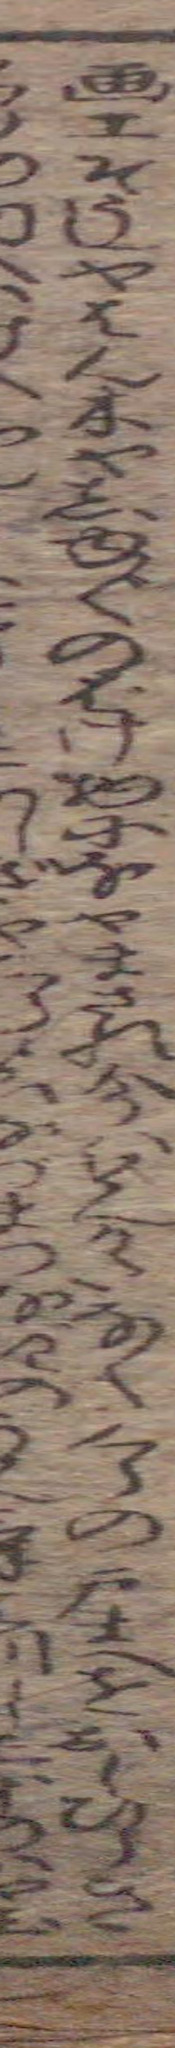画工そうしやはん木やしゆ〴〵のばけ物になやまされ今はいはんかたなくくらの戸まへをおしひらき
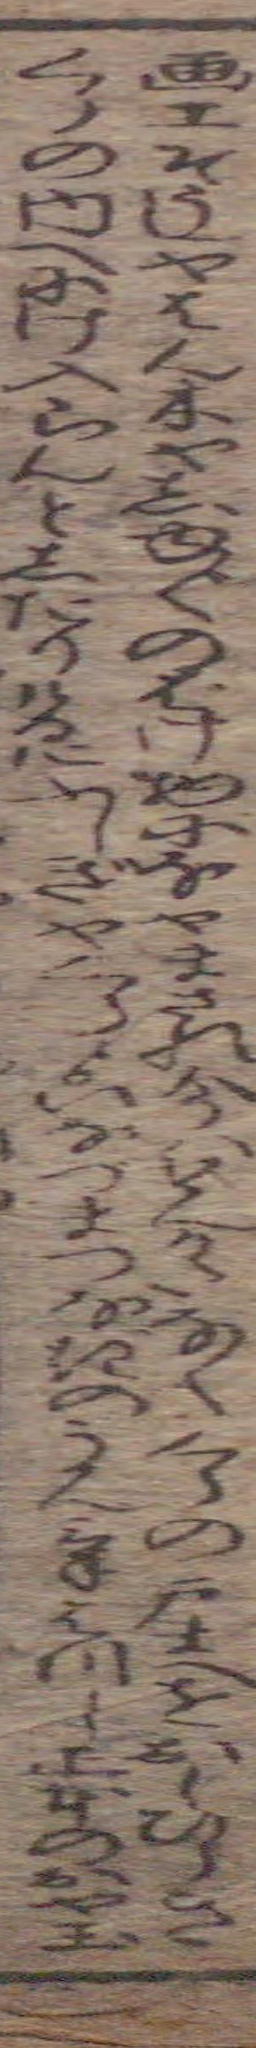くらの内へにけ入らんとしたりけるにふしぎやくらゟいなづまつなぎのうん気はつし正本のおや玉
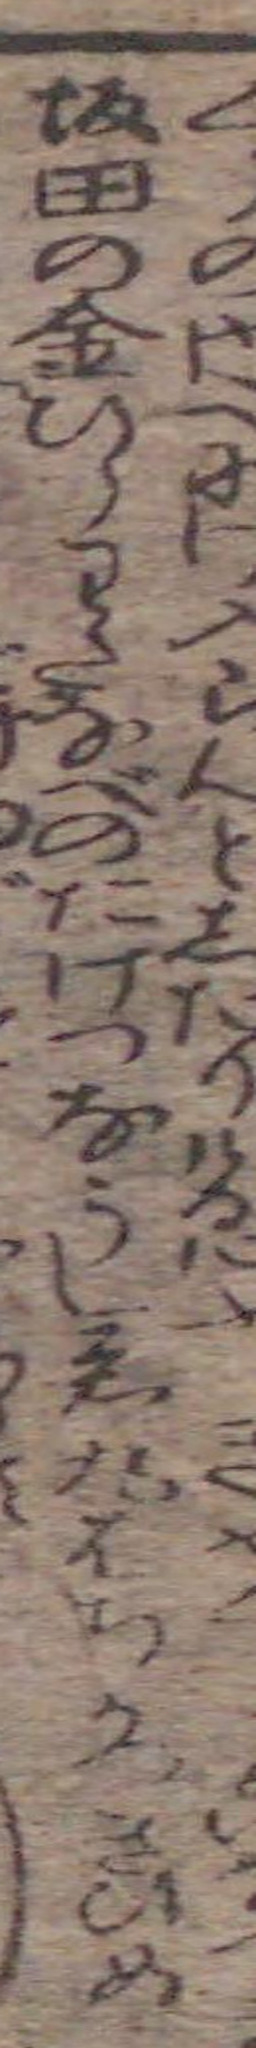坂田の金ひらわたなべのたけつなうし若丸はちかつきひめ
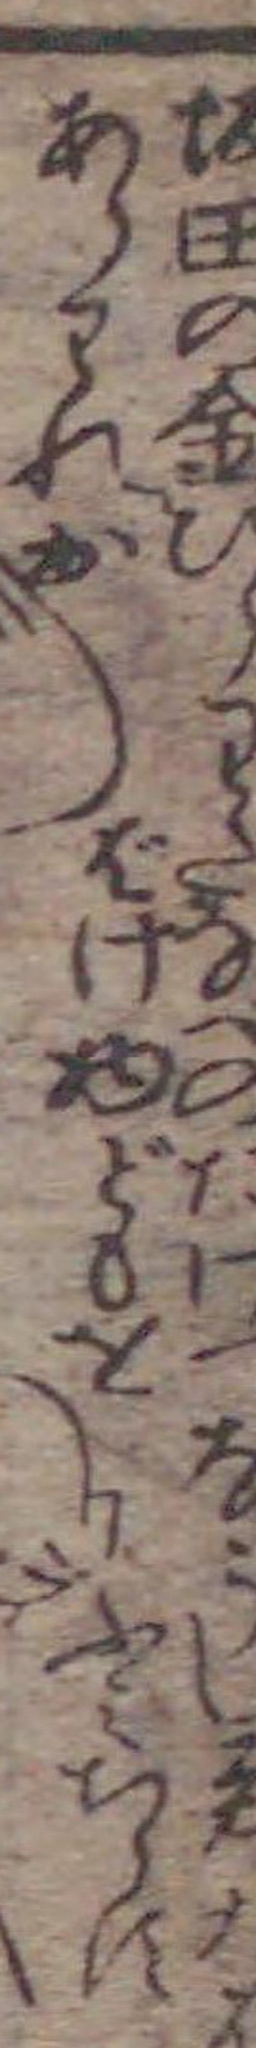あらわれ出ばけ物どもをふみちらす
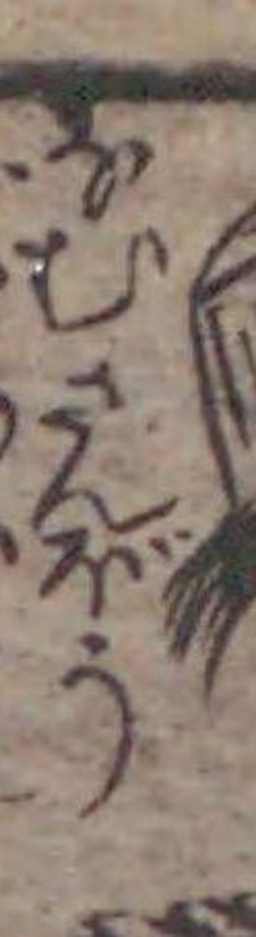なむさんぼう
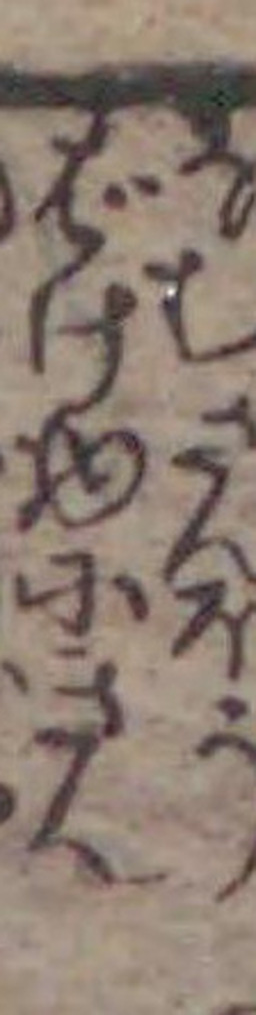ばけ物にきん
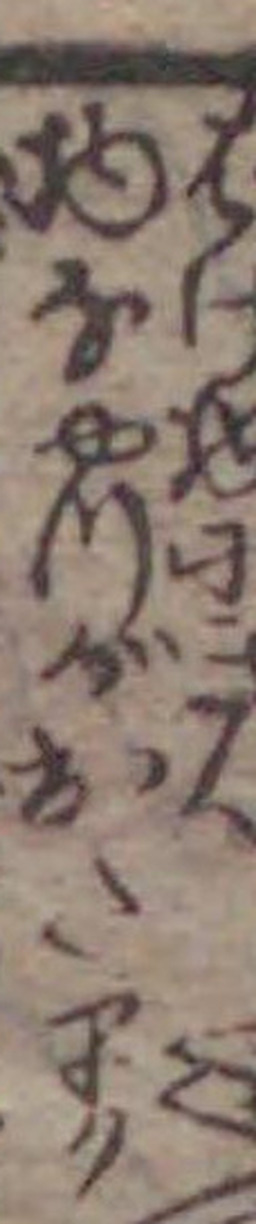物なやつが出た早く
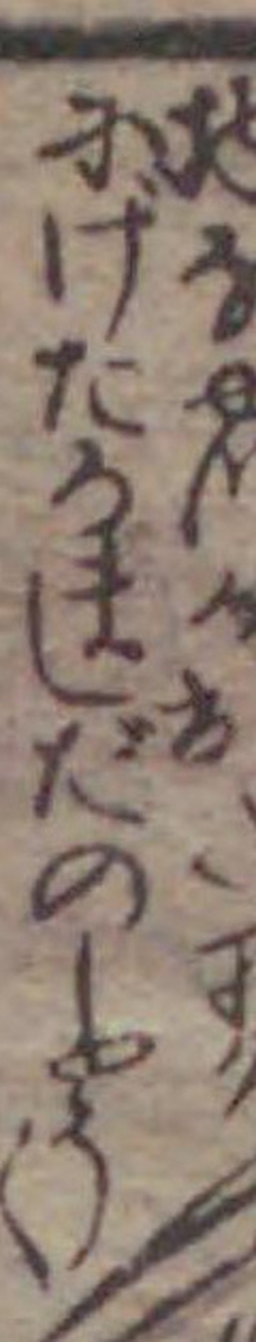にげたかかましだのしやう
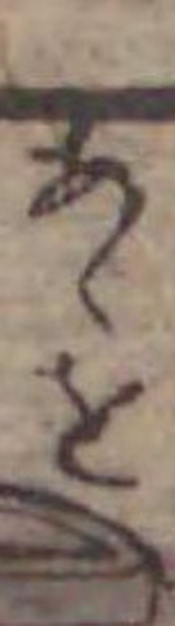あくを
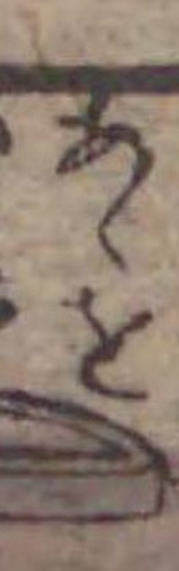あくを
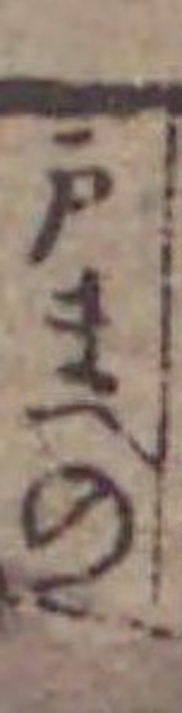戸まへの
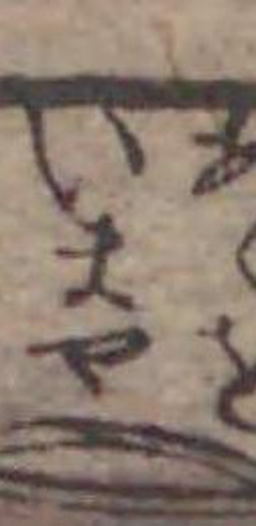いまや
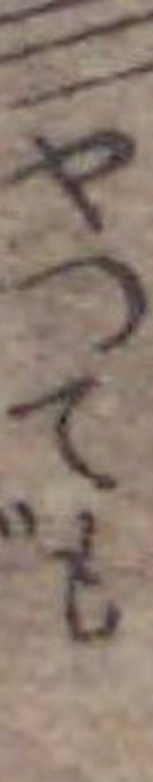やつても
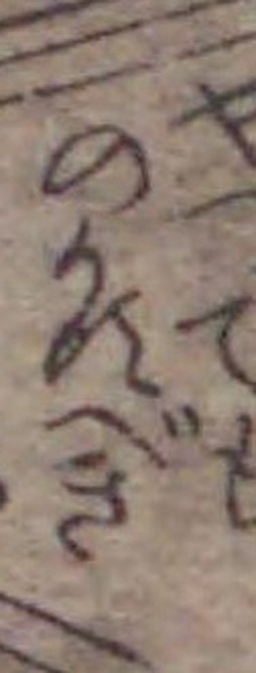のかすべき

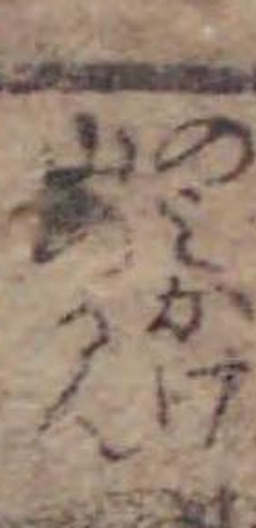山のかん
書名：辞闘戦新根 （国会）
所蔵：国立国会図書館 National Diet Library, JAPAN
